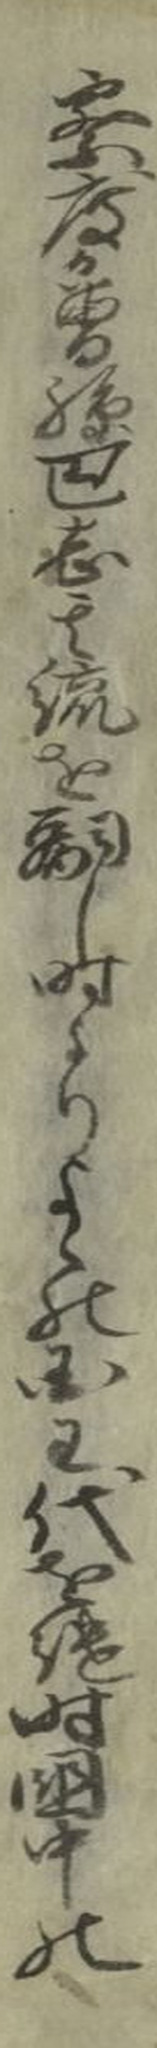察度の曾孫巴資其流を嗣し時よりよゝの国王代を遣時国中の
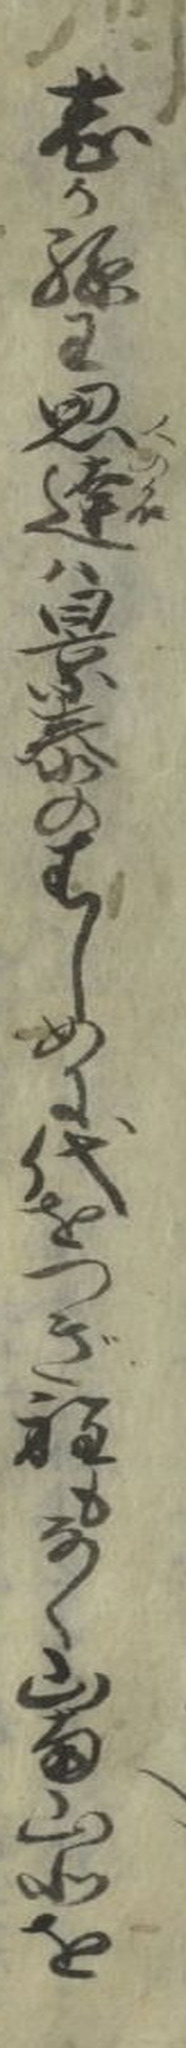志か孫王恩達は景泰のむしめに代をつぎ程もなく山南山北を
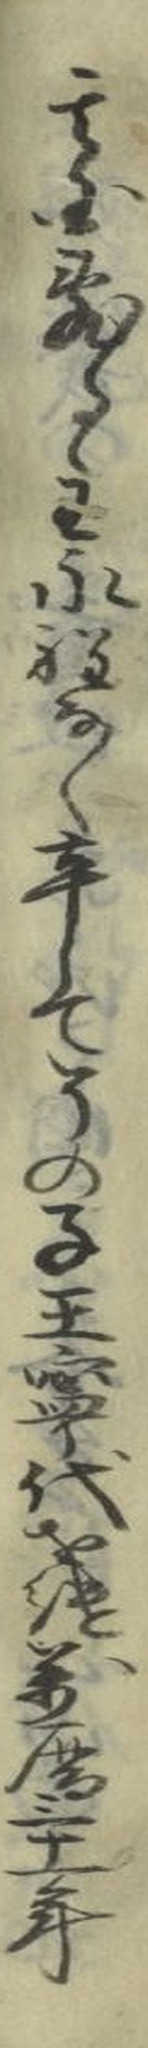其国王永程なく卒てその子王寧代を遣万暦三十一年
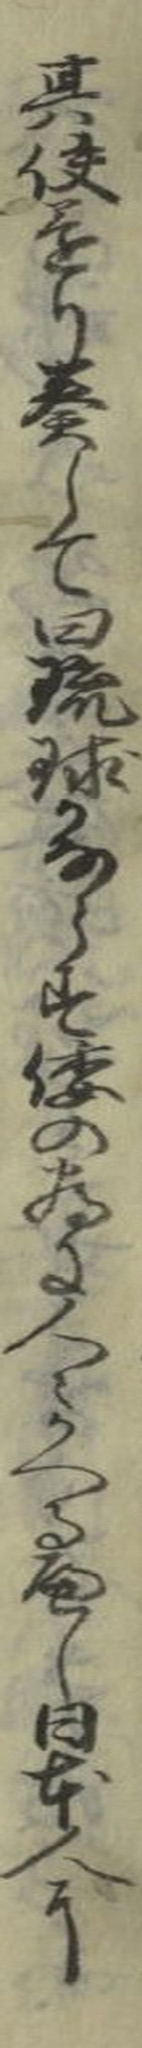其使送り奏して曰琉球かならす倭の為に人々かへるへし
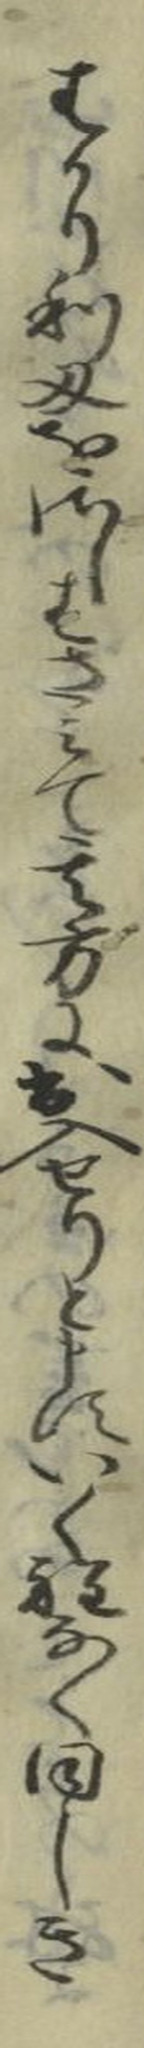はかり利刃をおしはさみて其方に出入せりと申すいく程なく同しき
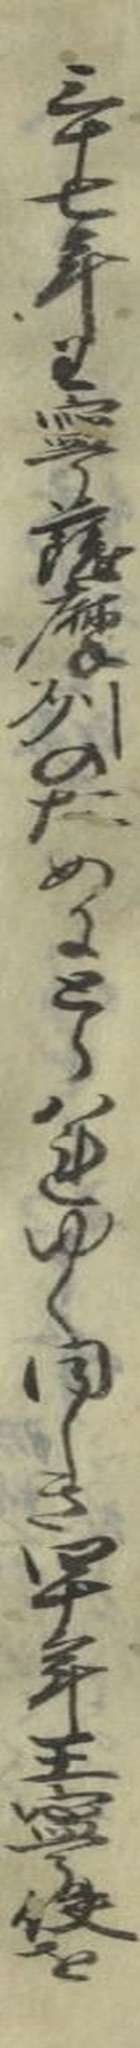三十七年王寧薩摩州のためにとらはれゆく同しき四十年王寧使を
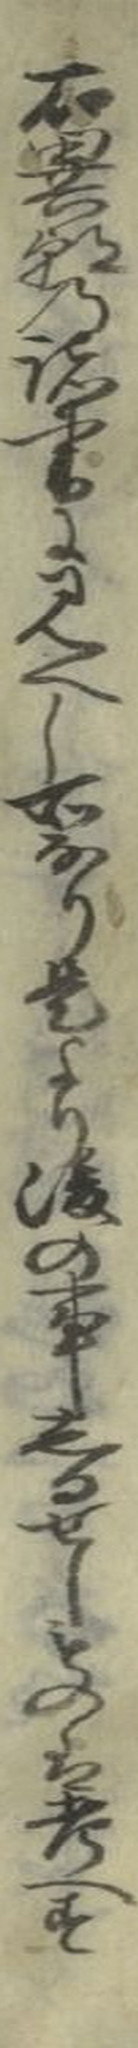右異朝の諸書に見へし所なり是より後の事しるせしものは考へす
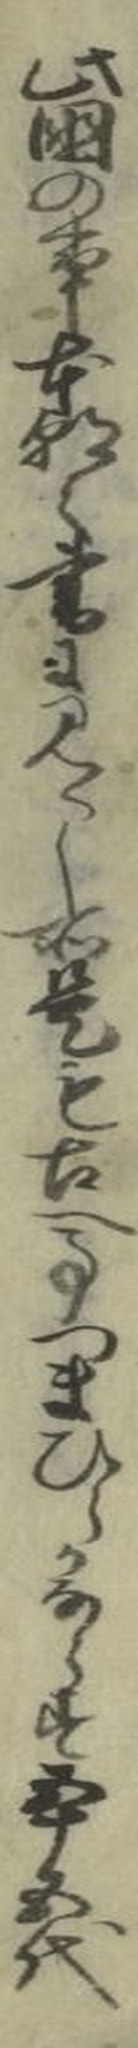此国の事本朝の書に見へし所是も古へ事つまひらかならす五十五代
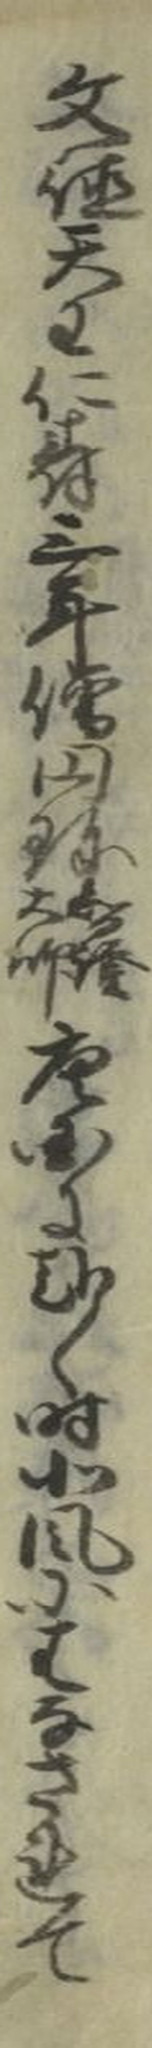文徳天皇仁寿三年僧円珍智証大師唐国に赴く時北風にはなされて
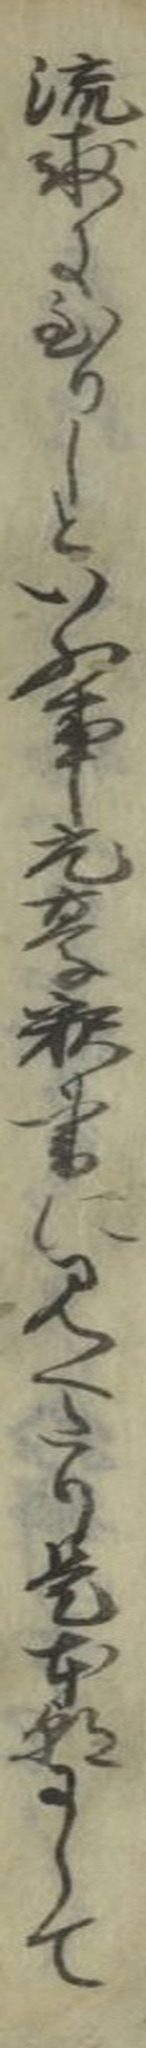琉球に至りしといふ事元亨釈書に見へたり是本朝にして
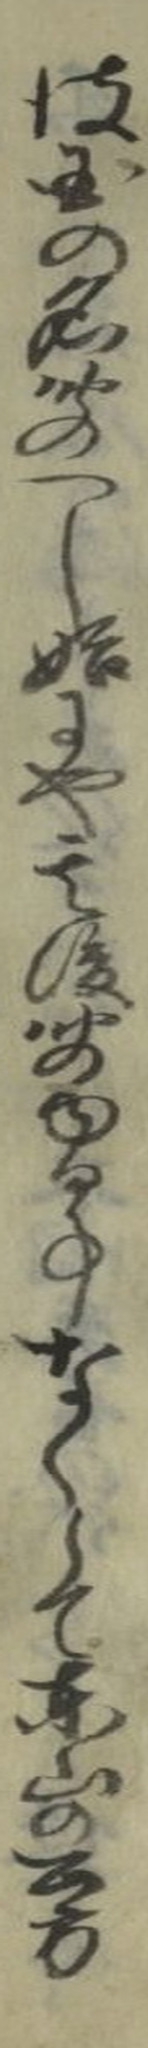彼国の名聞へし始にや其後聞ゆる事なくして東山の公方

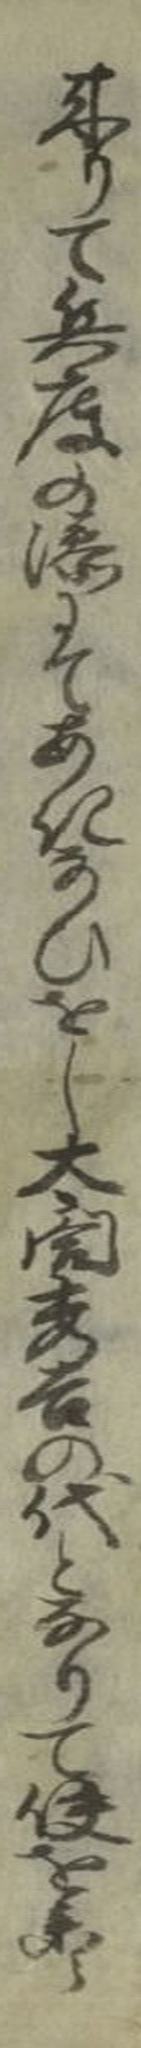来りて兵庫の湊にてあきなひをし太閤秀吉の代となりて使を參ら
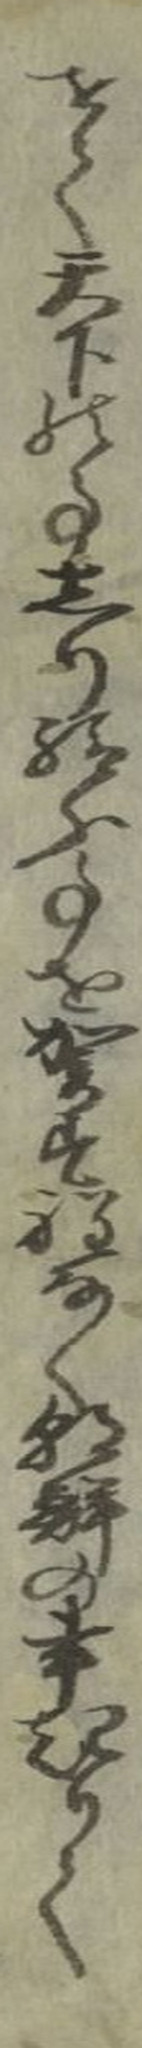せて天下の事しり給ふ事を賀す程なく朝鮮の事起りて
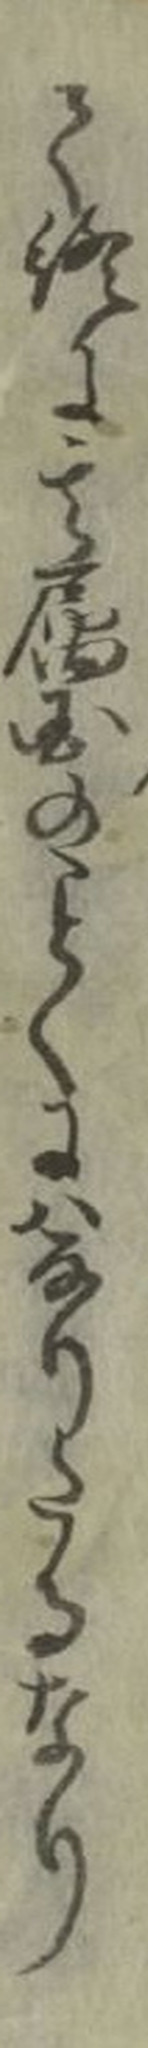て終に其属国のことくにはなりたるなり
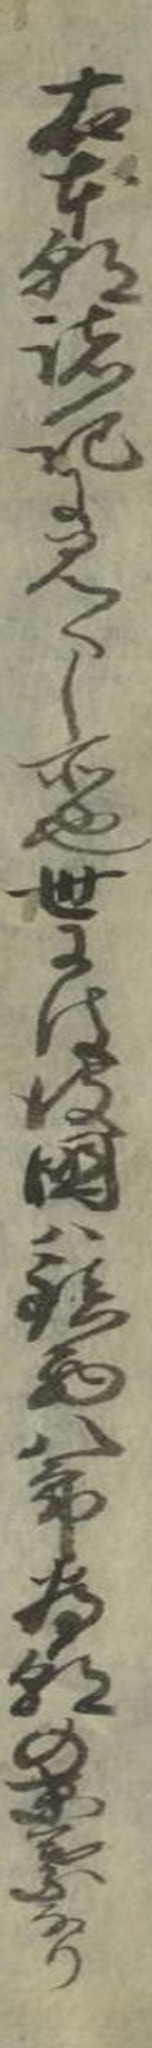右本朝諸記に見へし所也世には彼国は鎮西八郎為朝の末孫なり
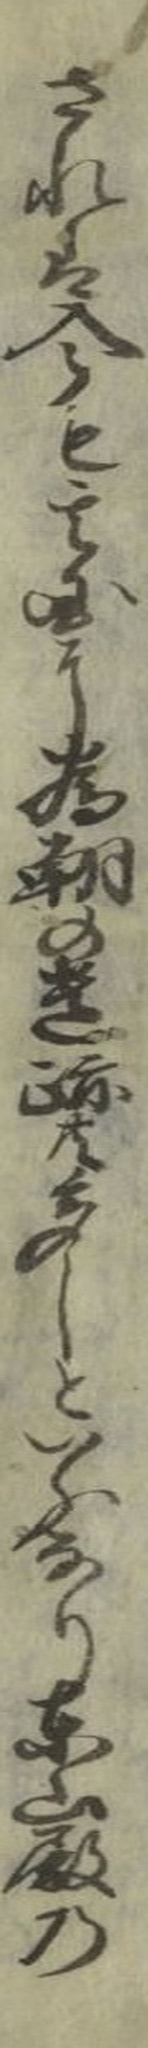されは今も其国に為朝の遺跡共多しといふなり東山殿の
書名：琉球人来朝之記
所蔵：University of the Ryukyus Library
